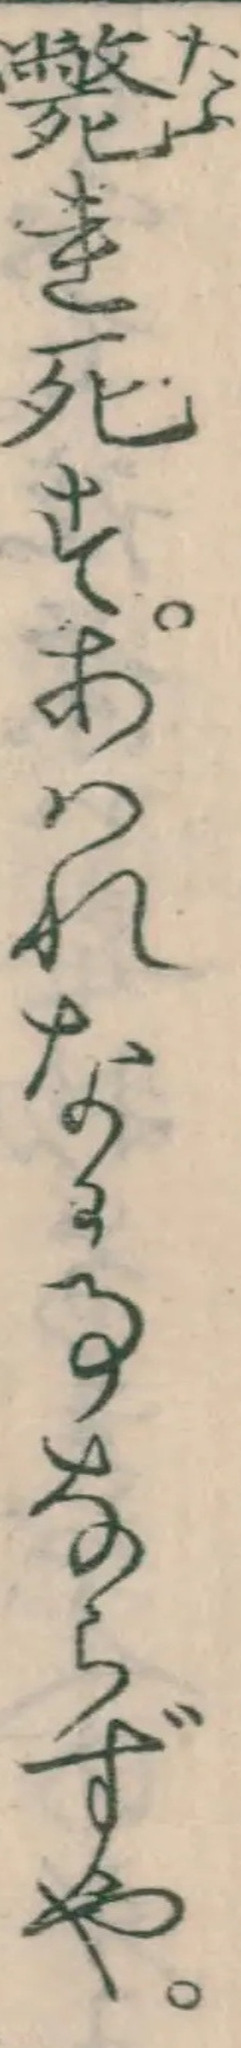斃れ死す。あはれなる事ならずや。
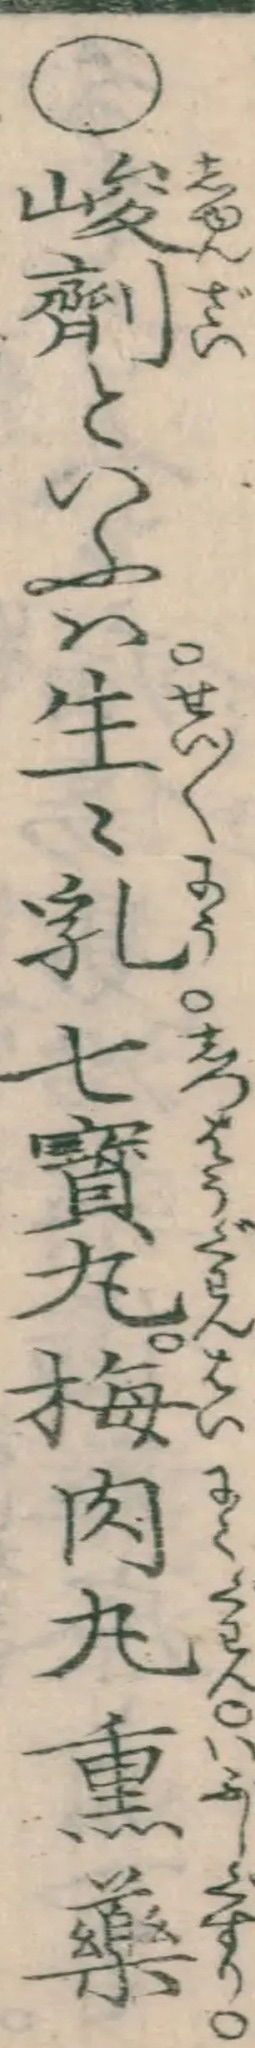〇峻劑といふは。正々乳。七寳丸。梅肉丸。薫藥。
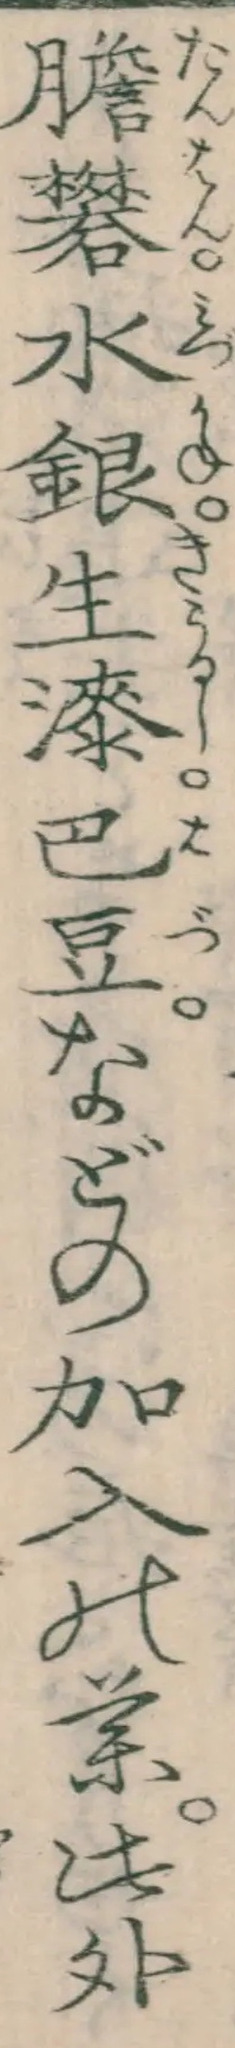膽礬。水銀。生漆。巴豆。などの加入藥。法外
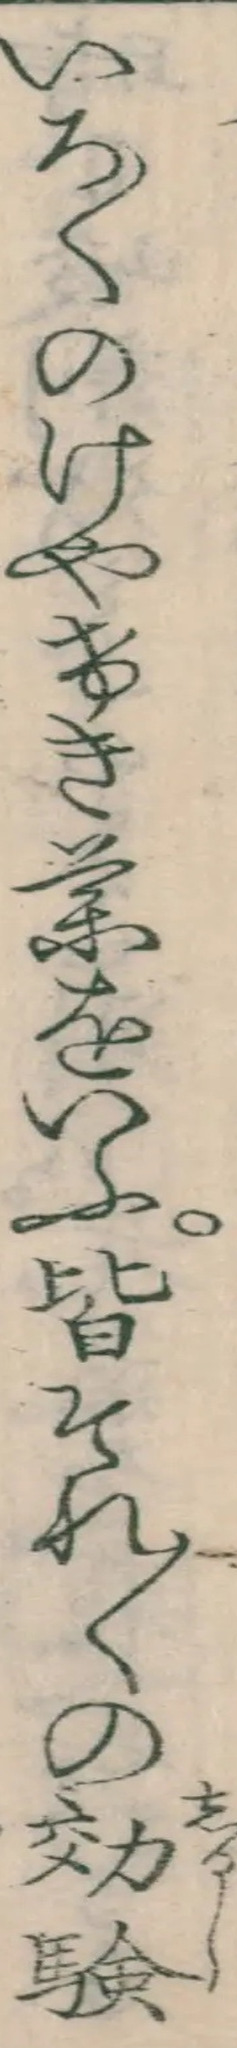いろ〳〵のけやけき藥をいふ。皆それ〳〵の効験
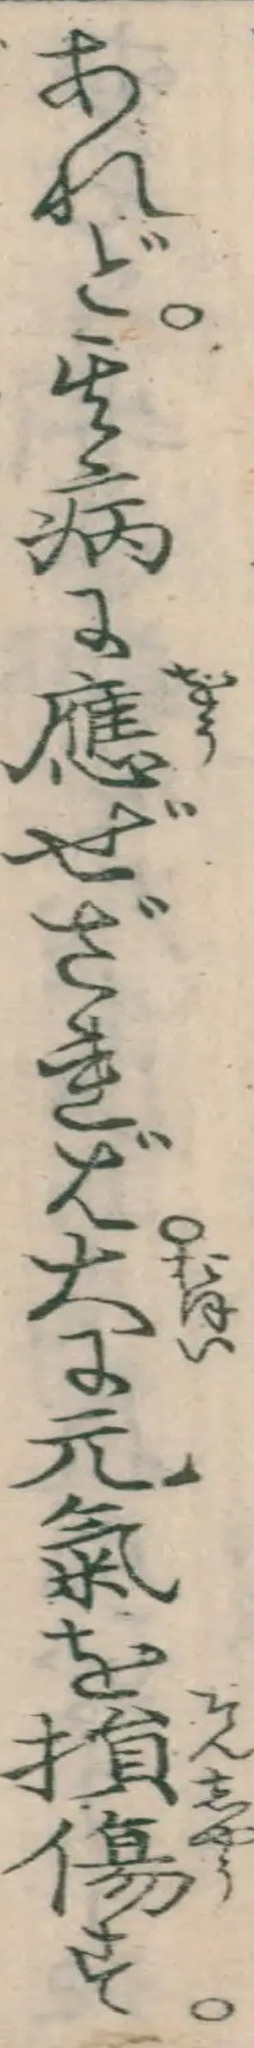あれど。其病に應ぜざれば。大に元氣を損傷す。
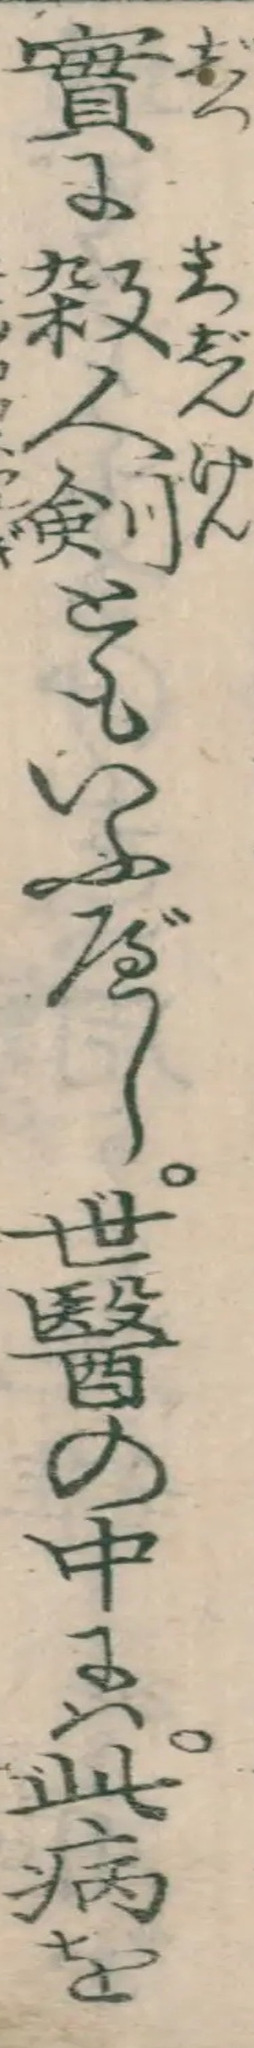實に殺人剣ともいふべし。世醫の中には。此病を
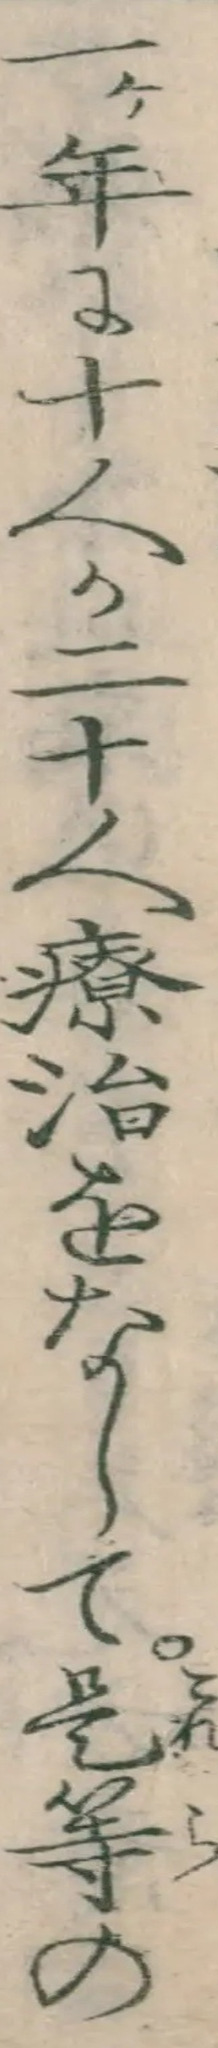一か年に十人か二十人療治をなして。是等の

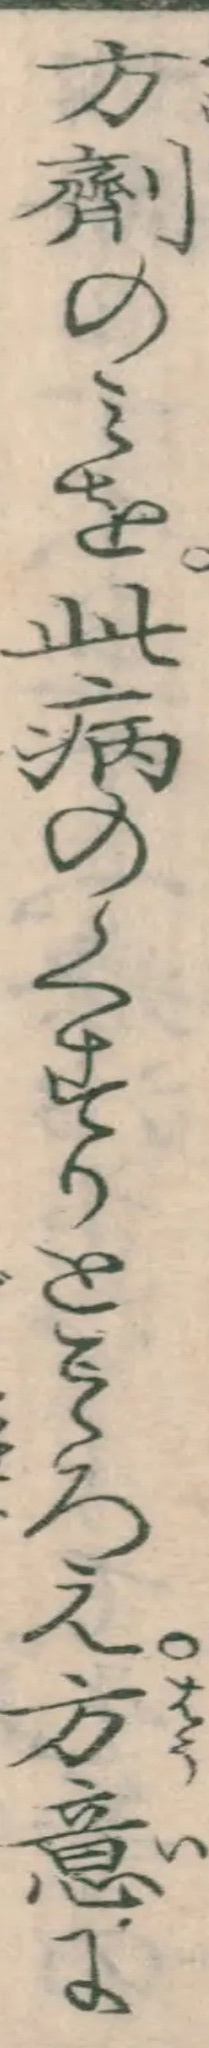方劑のみを。此病のくすりとこゝろえ。方意に
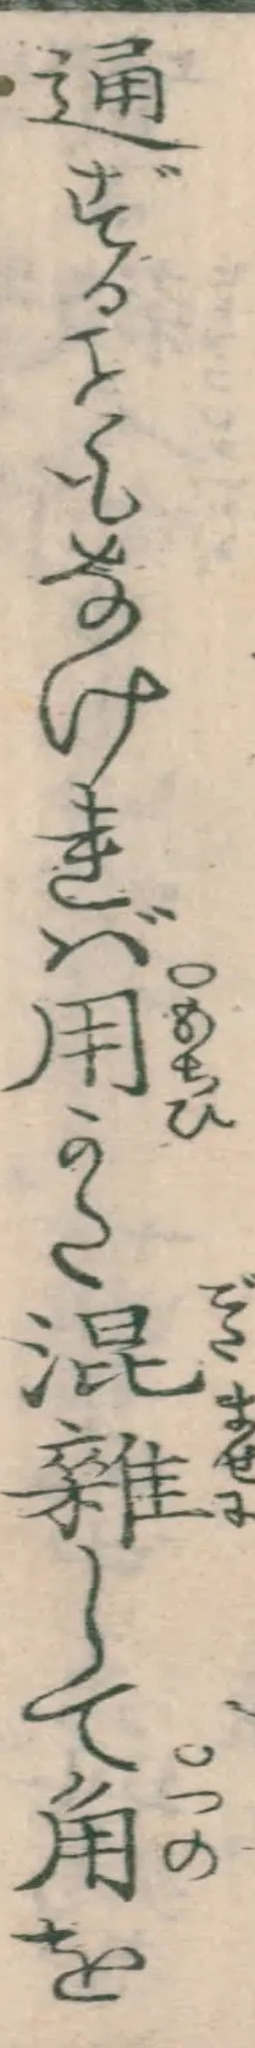通ずることもなければ。用かた混雜して。角を
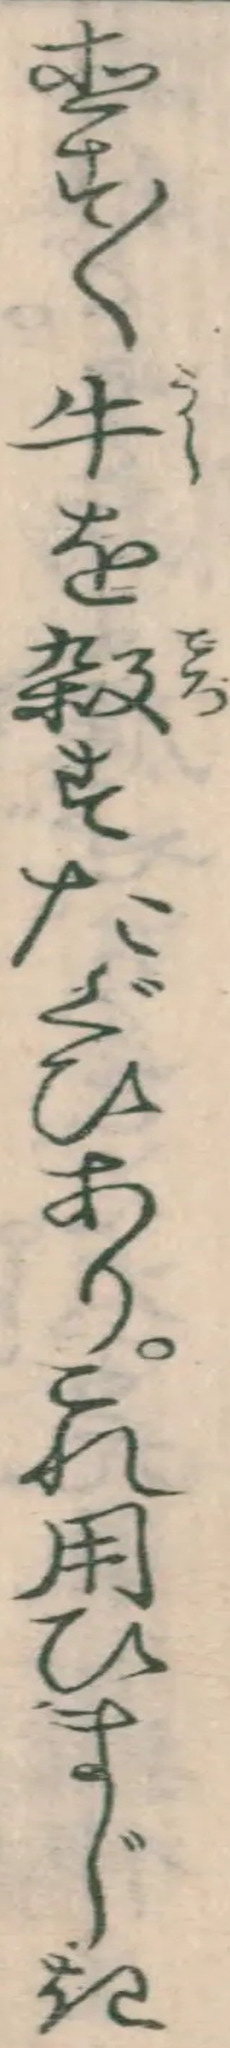直すく牛を殺すたぐひあり。これ用ひまじき
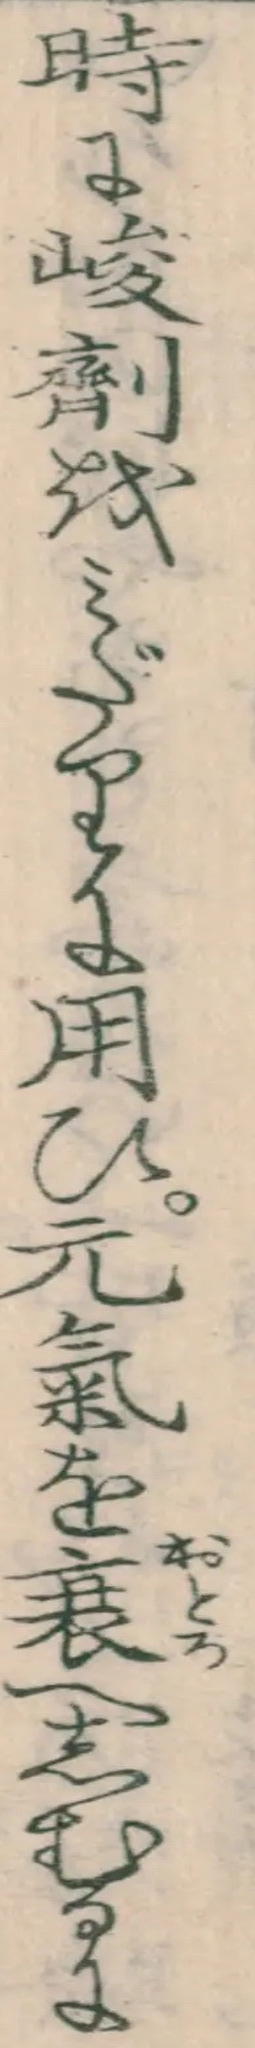時に峻劑をみだりに用ひ。元氣を衰へしむるに
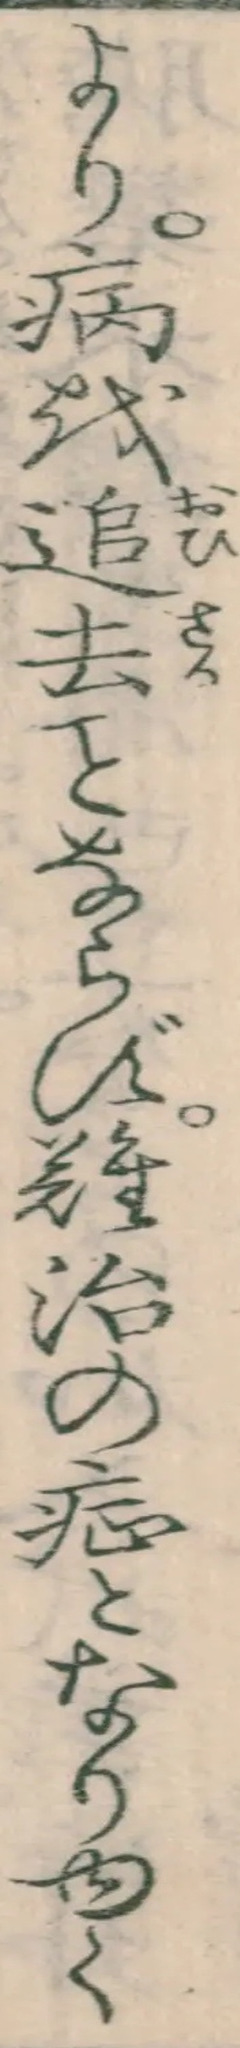より。病を追去ことならず。難治の症となりゆく
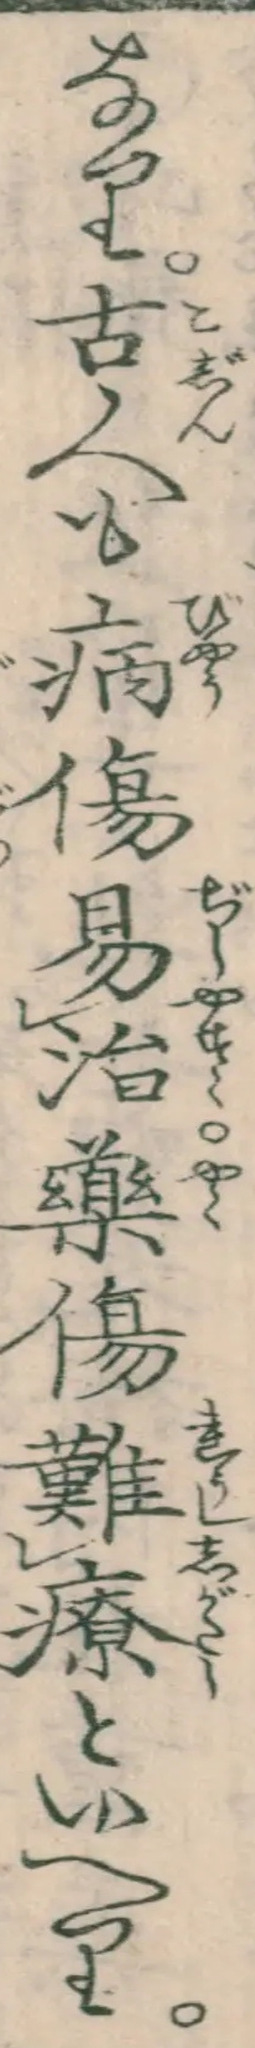なり。古人も病傷易治。藥傷難療といひり。
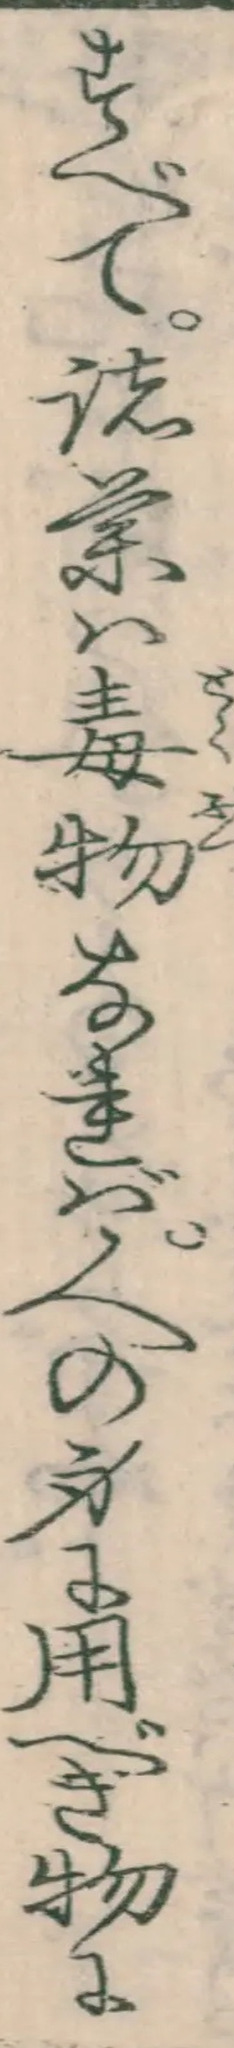すべて。諸藥は毒物なれば。人の身に用べき物に
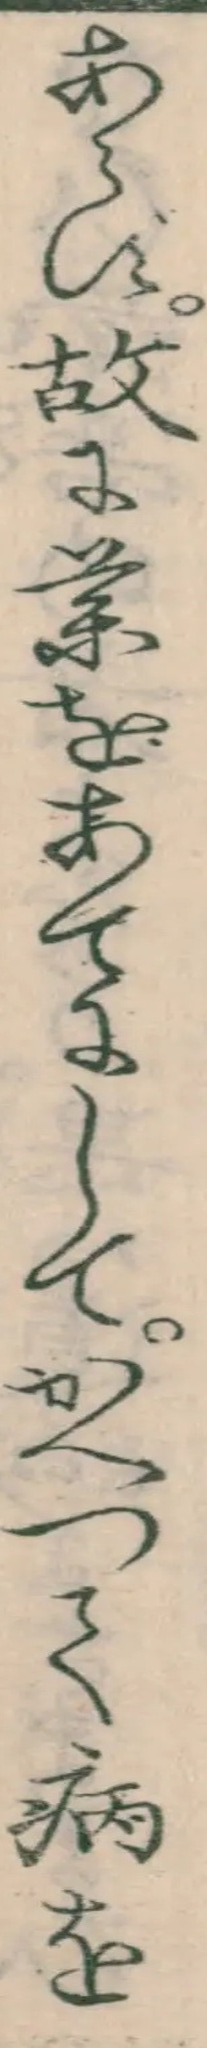あらず。故に藥をあたにして。かひつて病を
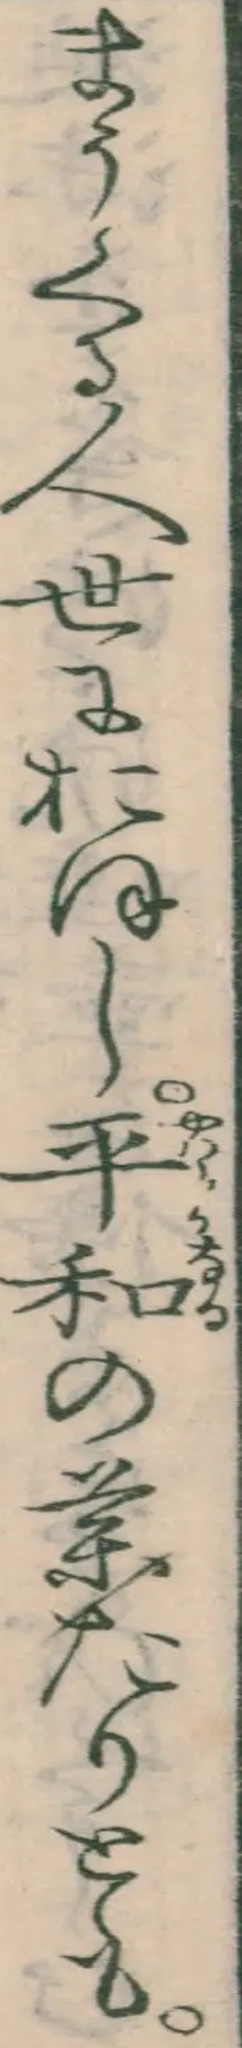まうくる人世におほし。平和の藥なりとも。
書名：瘡家示訓
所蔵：国立国会図書館 National Diet Library, JAPAN
